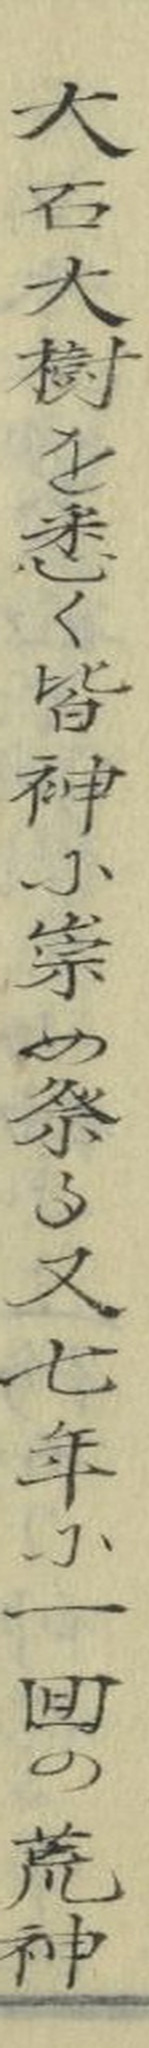大石大樹を悉く皆神に崇め祭る又七年に一回の荒神
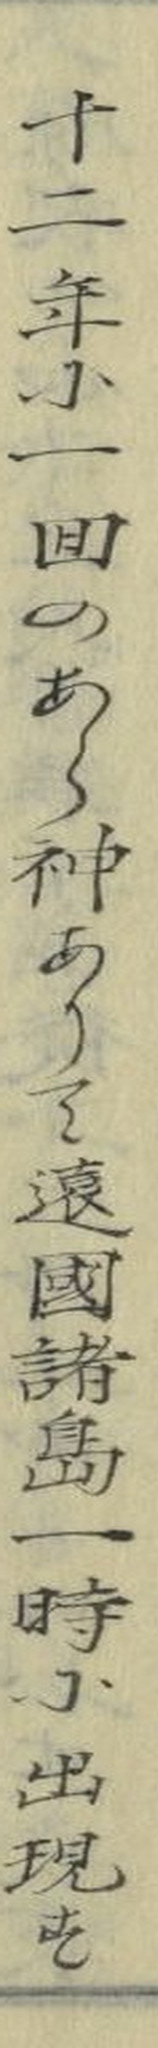十二年に一回のあら神ありて遠国諸島一時に出現す
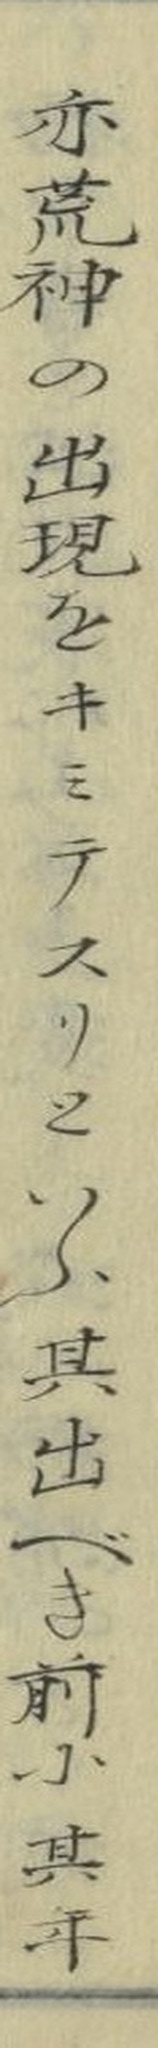亦荒神の出現をキミテスリといふ其出べき前に其年
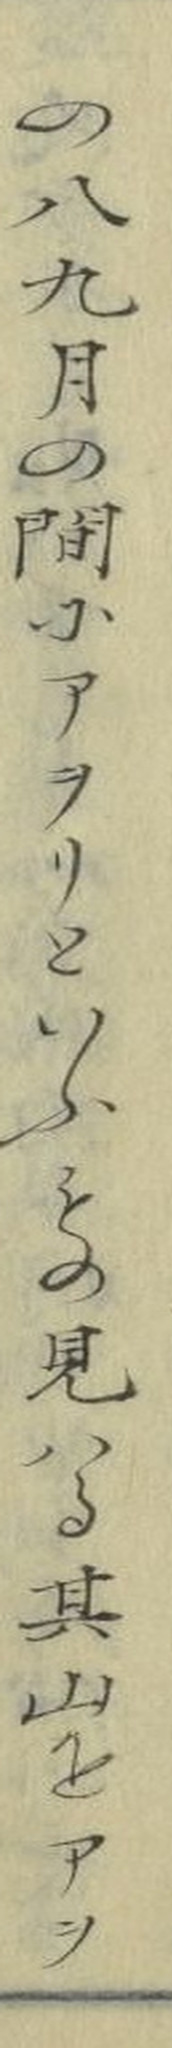の八九月の間にアヲリといふもの見はる其山をアヲ
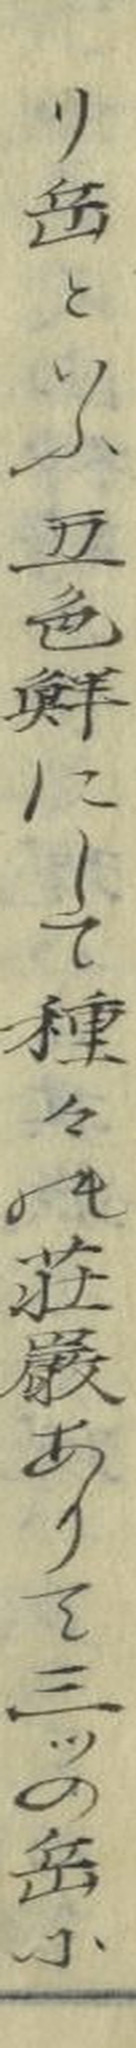リ岳といふ五色鮮にして種々の荘厳ありて三ツの岳に
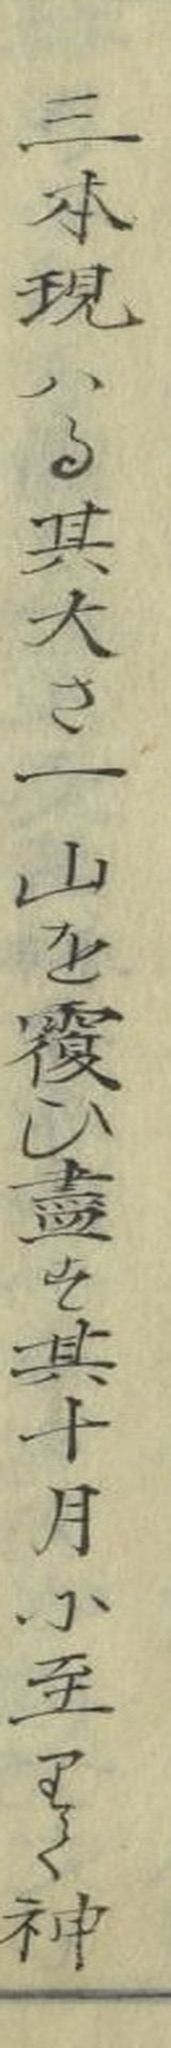三本現はる其大さ一山を覆ひ尽す其十月に至りて神
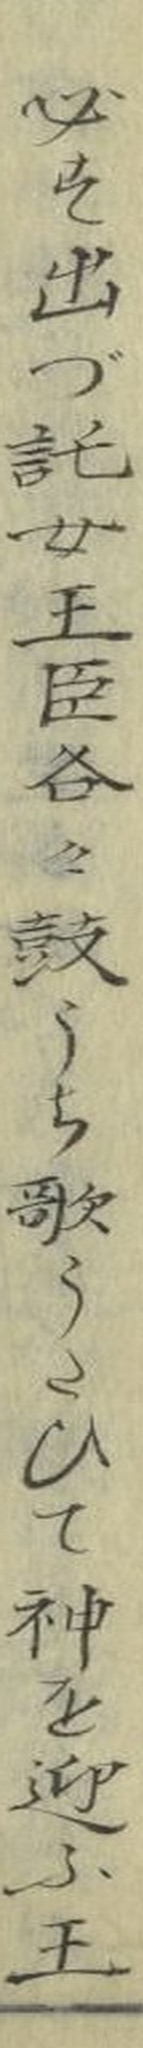必す出づ託女王臣各々鼓うち歌うたひて神を迎ふ王

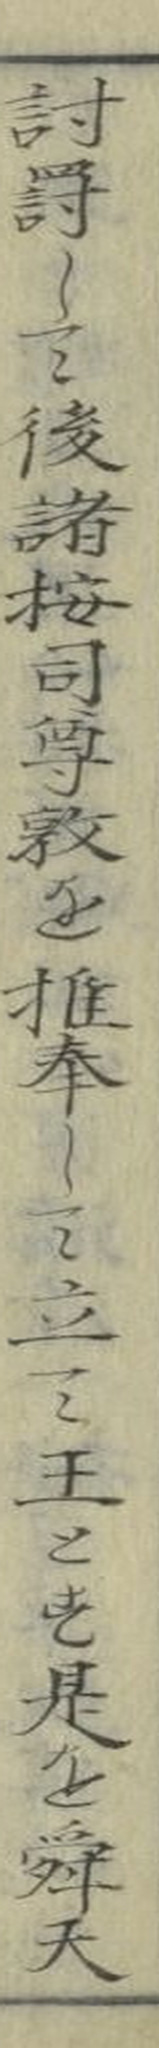討罰して後諸按司尊敦を推挙して立て王とす是を舜天
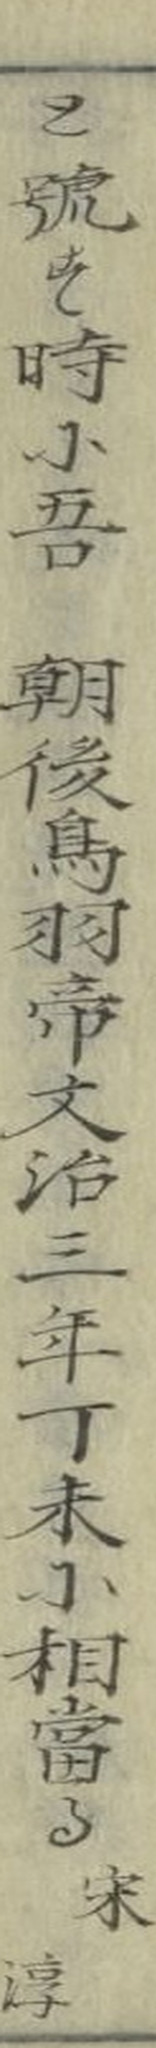と号す時に吾朝後鳥羽帝文治三年丁未に相当る宋淳
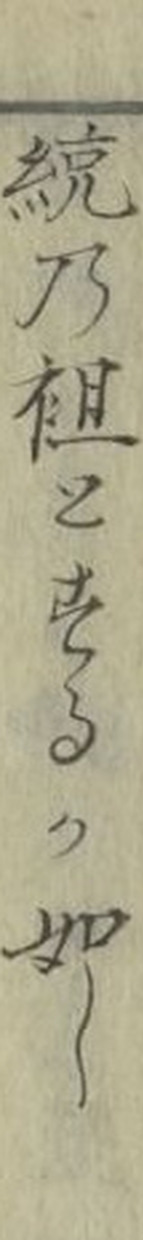統の祖とするか如し
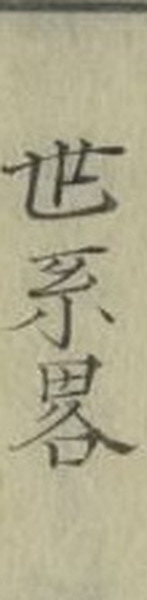世系略
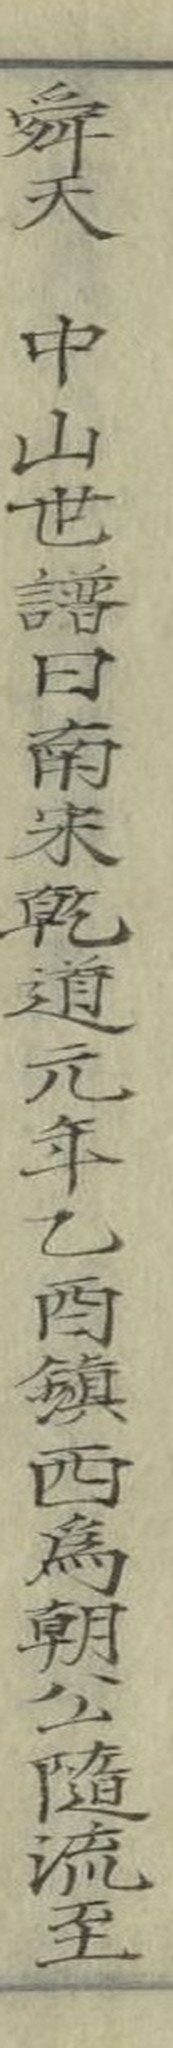舜天中山世譜曰南宋乾道元年乙酉鎮西為朝公随流至
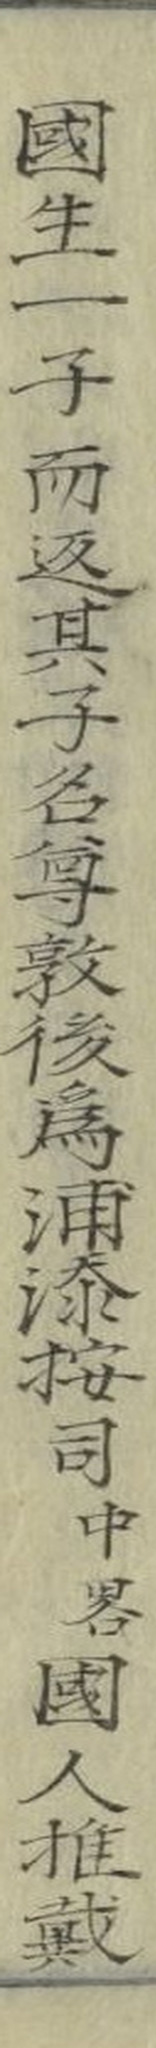国生一子而返其子名尊敦後為浦添按司中略国人推戴
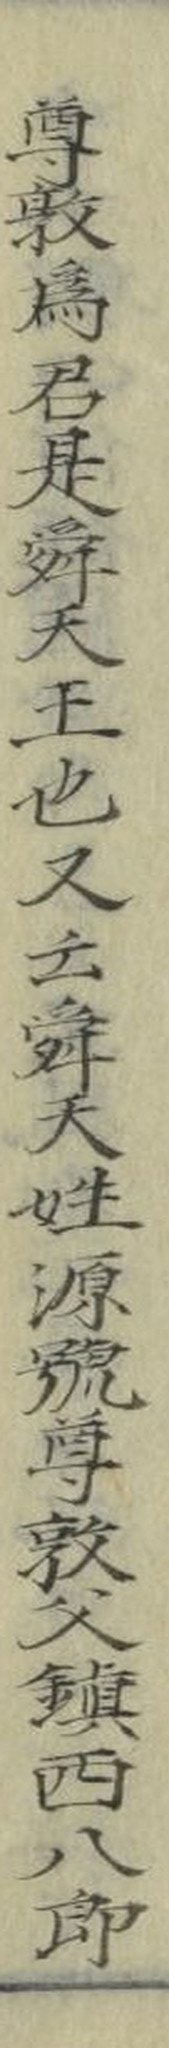尊敦為君是舜天王也又云舜天姓源号尊敦父鎮西八即
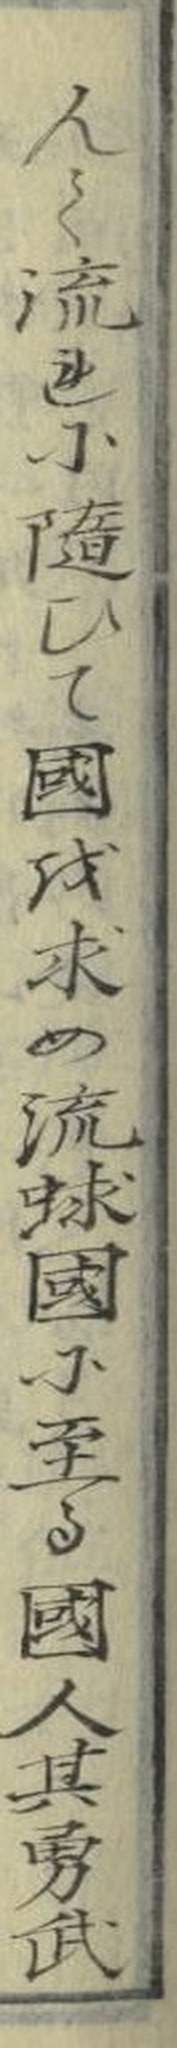んて流れに随ひて国を求め流蛷国に至る国人其勇武
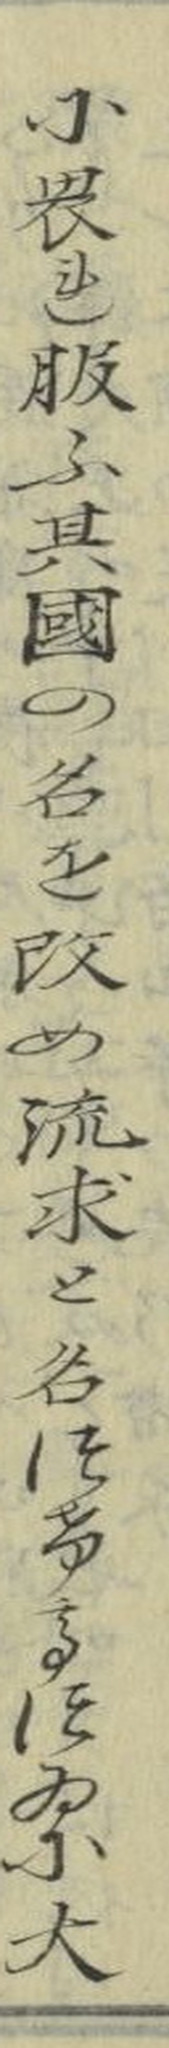に畏れ服ふ其国の名を改め流求と名つけてつゐに大
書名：琉球沿革志 下
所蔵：University of the Ryukyus Library
